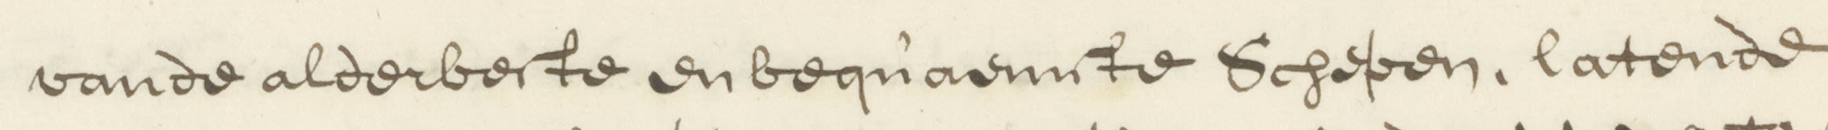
vande alderbeste en bequaemste Schepen, latende
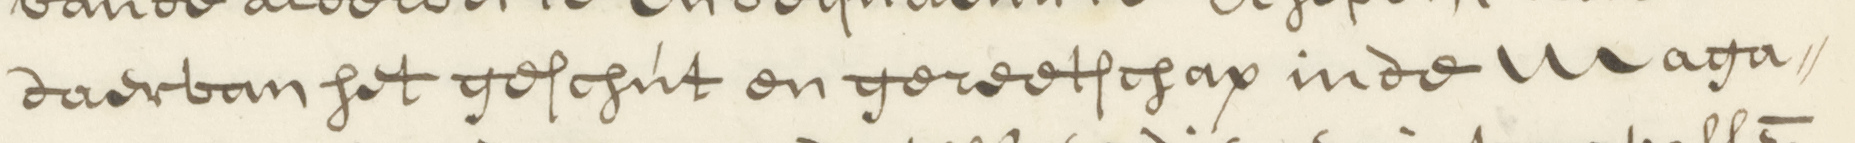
daervan het geschut en gereetschap inde Maga„
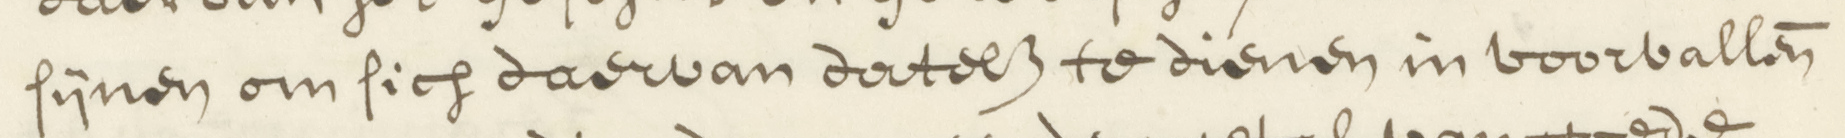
sijnen om sich daervan datel te dienen in voorvallen
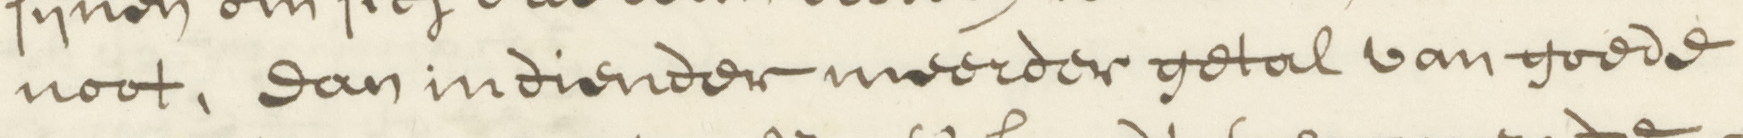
noot. Dan indiender meerder getal van goede
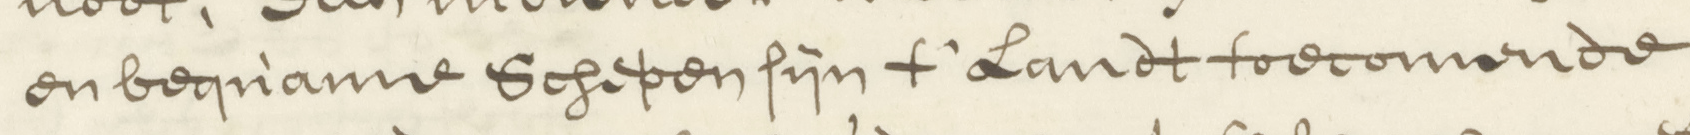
en bequame Schepen sijn t'Landt toecomende
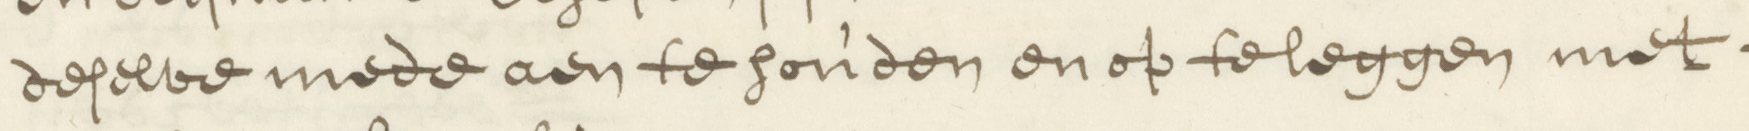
deselve mede aen te houden en op te leggen met
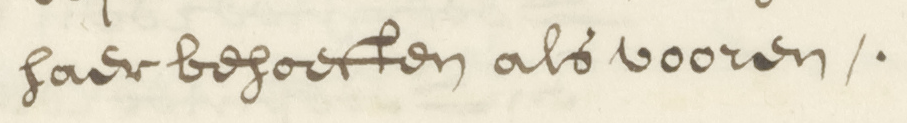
haer behoeften als vooren.
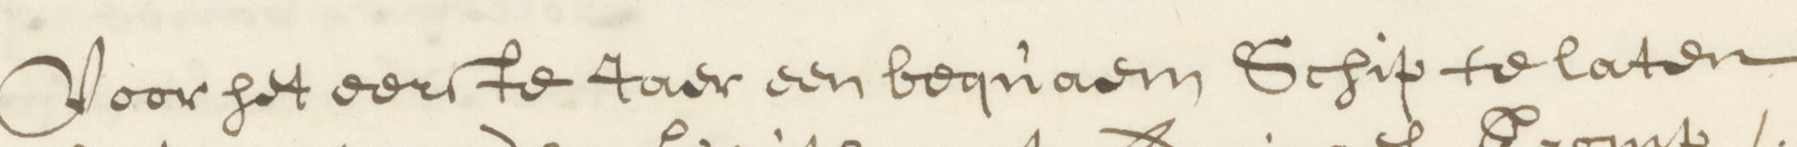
Voor het eerste Jaer een bequaem Schip te laten
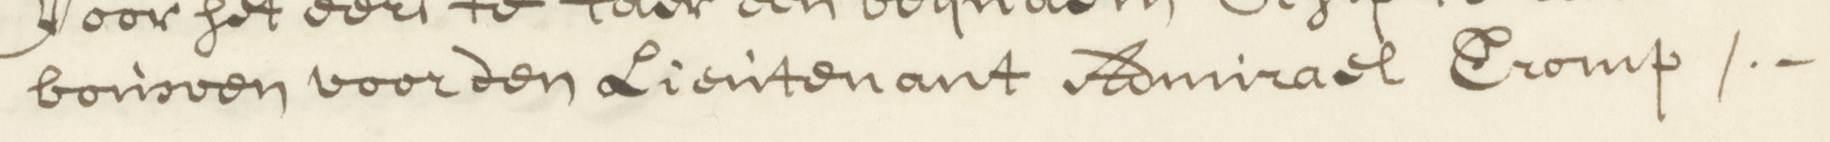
bouwen voor den Lieutenant Admirael Tromp. -
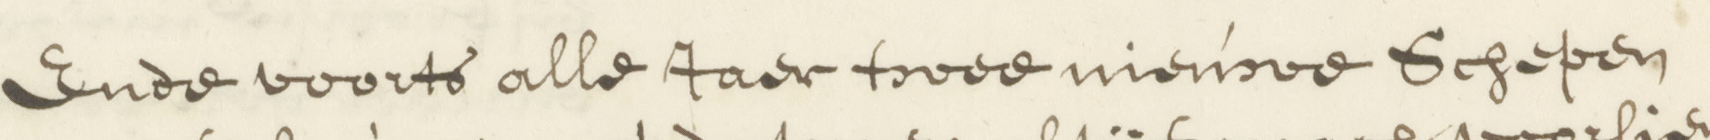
Ende voorts alle Jaer twee nieuwe Schepen
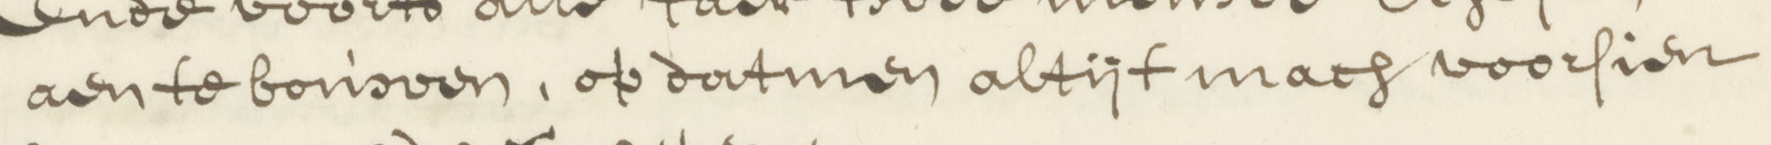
aen te bouwen, op datmen altijt mach voorsien
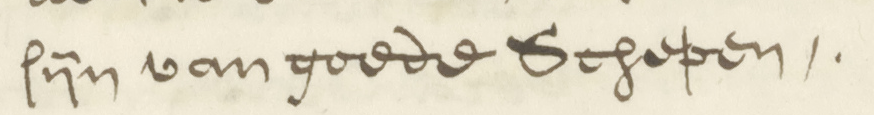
sijn van goede Schepen.
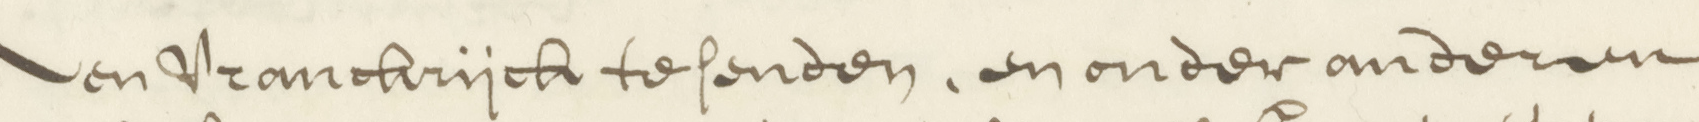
Aen Vranckrijck te senden, en onder anderen
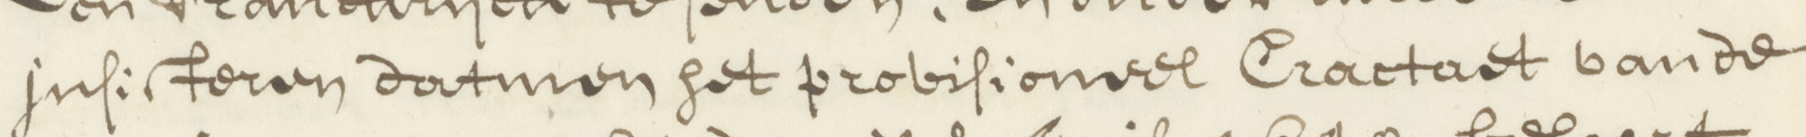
insisteren datmen het provisioneel Tractaet vande
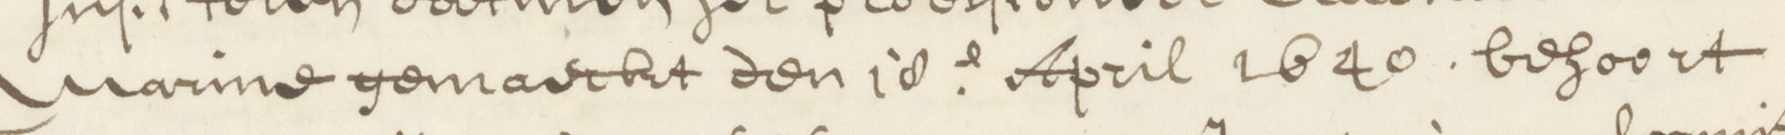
Marine gemaeckt den 18e. April 1640. behoort
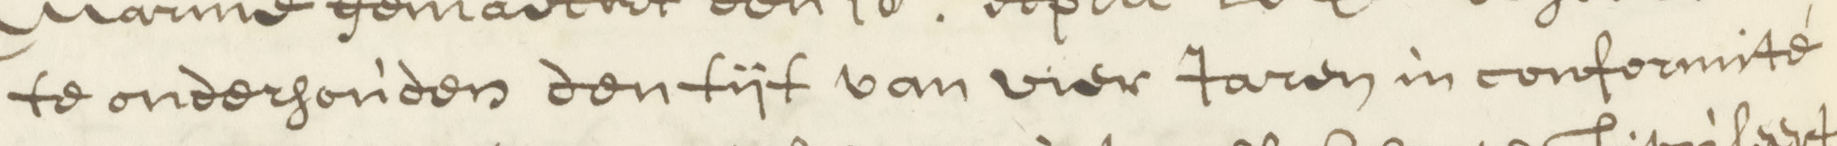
te onderhouden den tijt van vier Jaren in conformité
